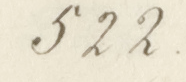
522
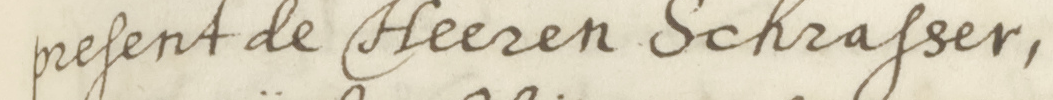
present de Heeren Schrasser,
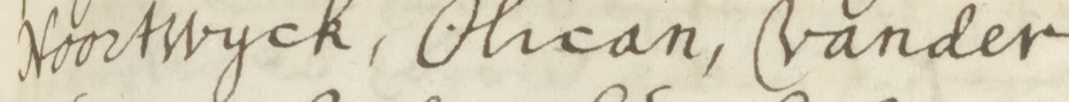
Noortwijck, Olican, Vander
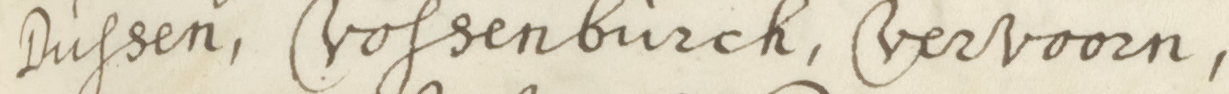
Dusen, Vossenburch, Vervoorn,
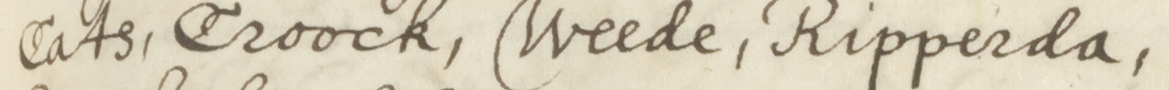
Cats, Croock, Weede, Ripperda,
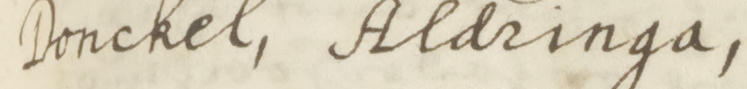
Donckel, Aldringa,
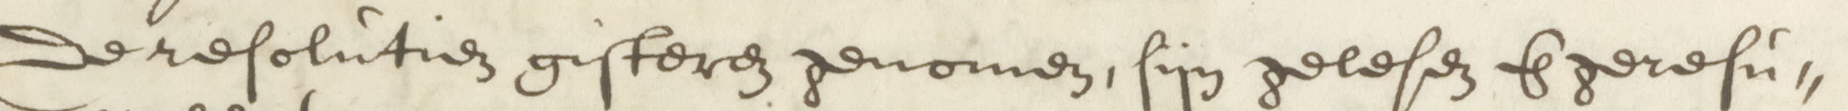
De resolutien gisteren genomen, sijn gelesen & geresu„
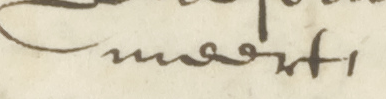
meert.
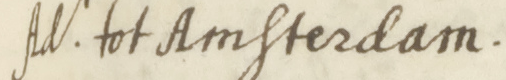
Adt. tot Amsterdam.
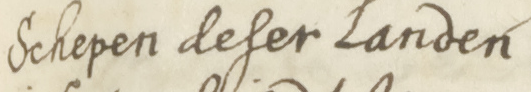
Schepen deser Landen
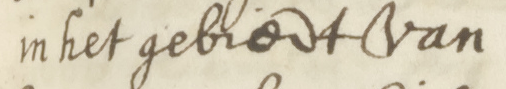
in het gebiedt van
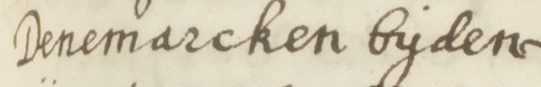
Denemarcken bijden
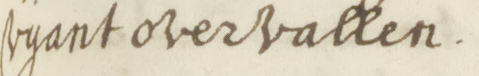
vijant overvallen.
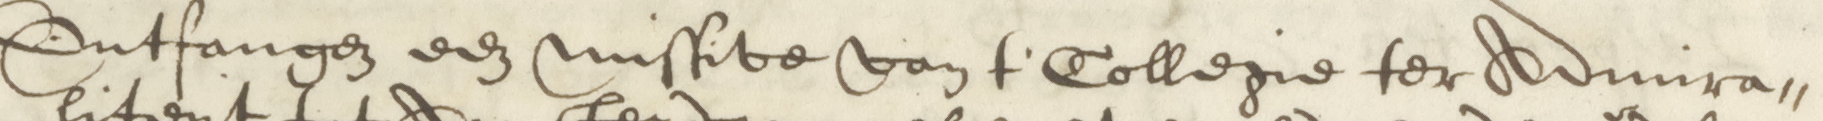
Ontfangen een missive van t‛Collegie ter Admira„
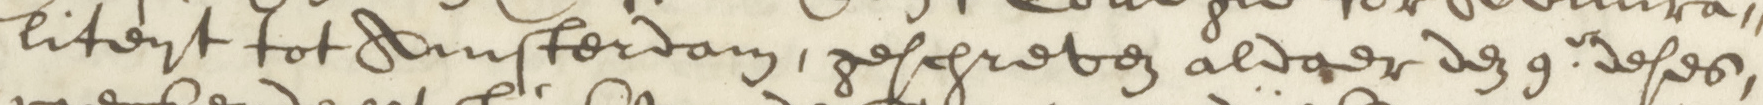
liteijt tot Amsterdam, geschreven aldaer den 9e deses,
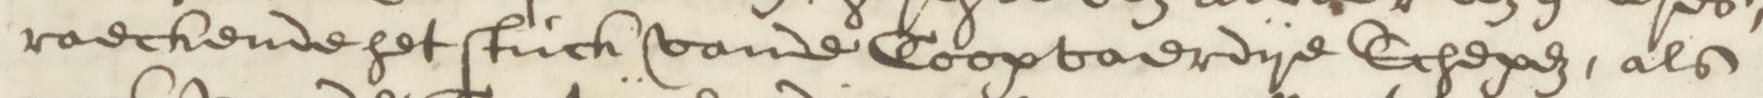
raeckende het stuck vande Coopvaerdije Schepen, als
